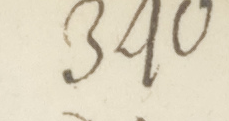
340
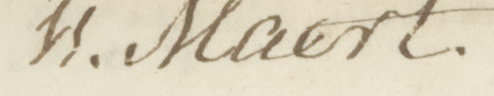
11. Maert.
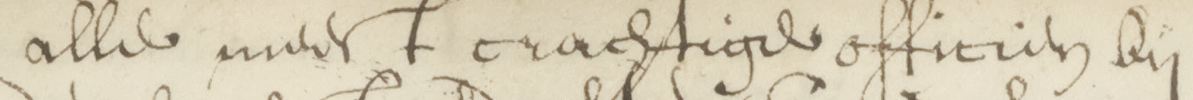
alle meest crachtige officien bij
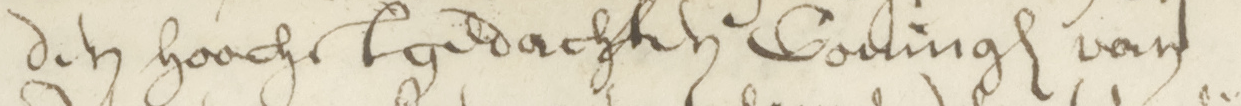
den hoochstgedachten Coningh van
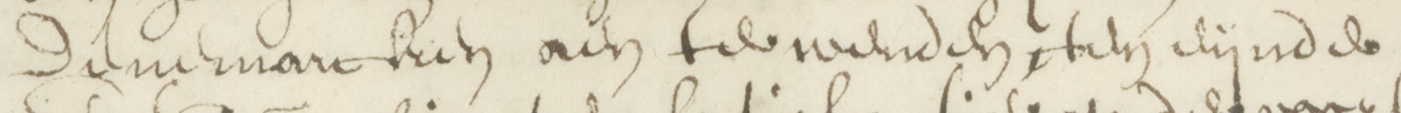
Denemarcken aen te wenden ten eijnde
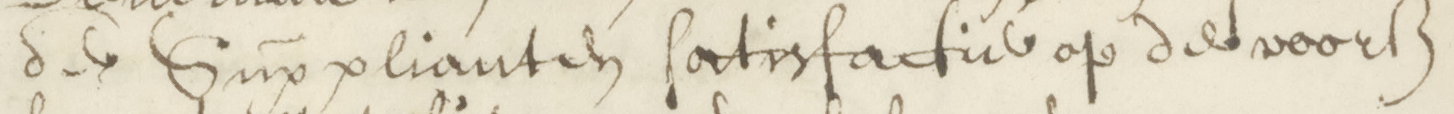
de Supplianten satisfactie op de voors
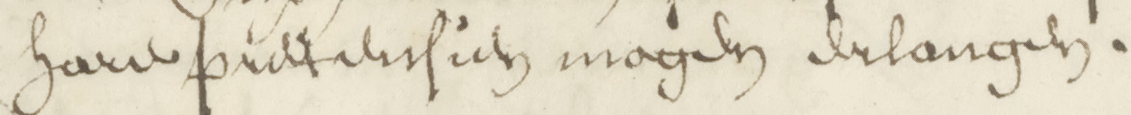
hare pretensien mogen erlangen.
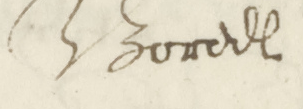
Boreel
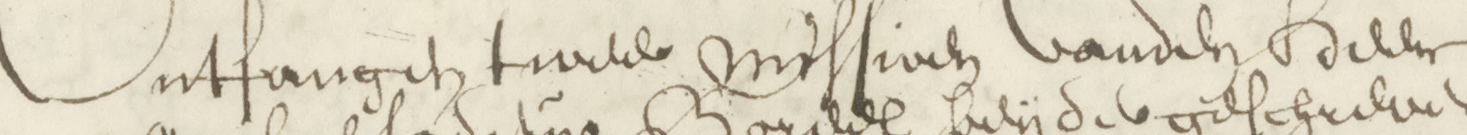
Ontfangen twee missiven vanden Heer
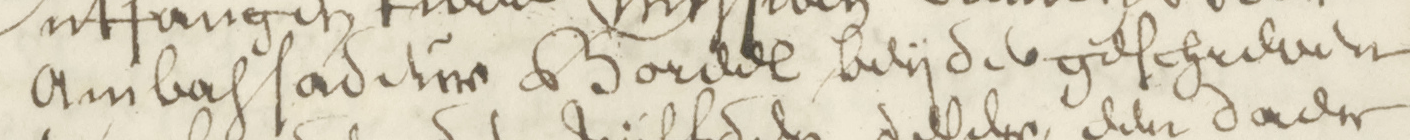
Ambassadeur Boreel beijde geschreven
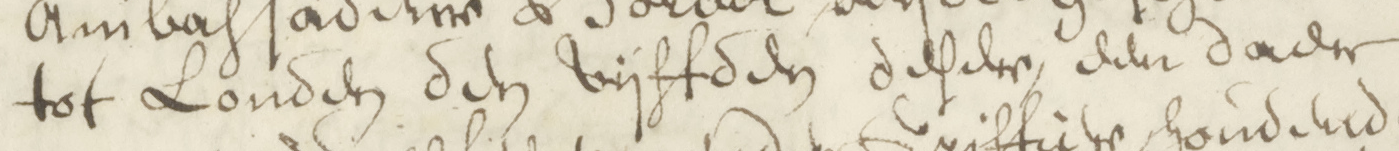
tot Londen den vijffden deser, een daer
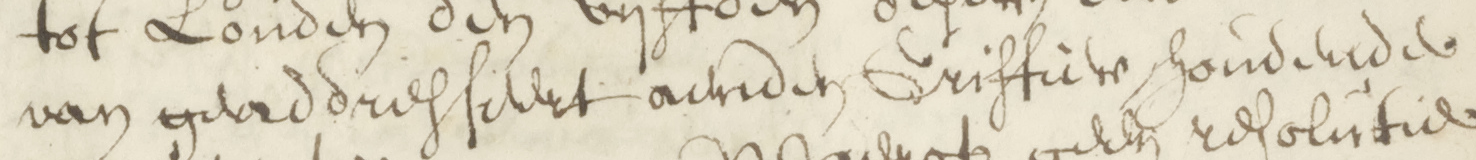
van geaddresseert aenden Griffier, houdende
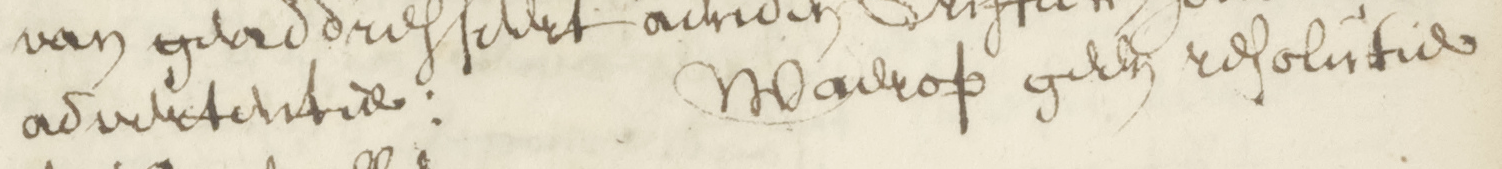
advertentie: Waerop geen resolutie
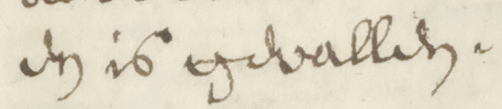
en is gevallen.
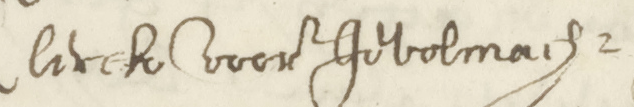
Clerck voor Gevolmach„
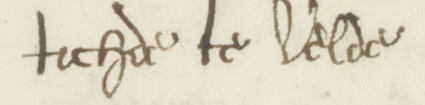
tichde te Velde
